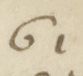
61
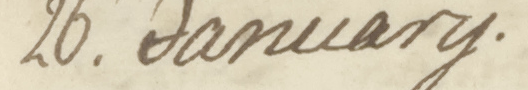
26. Januarij.
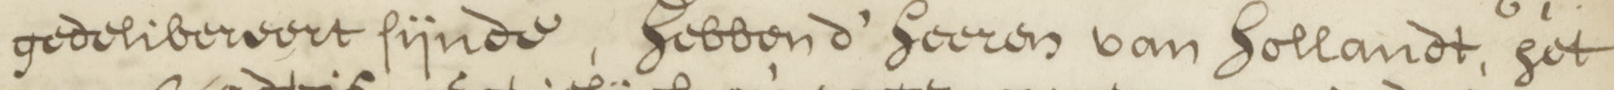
gedelibereert sijnde, hebben d'heeren van hollandt, het
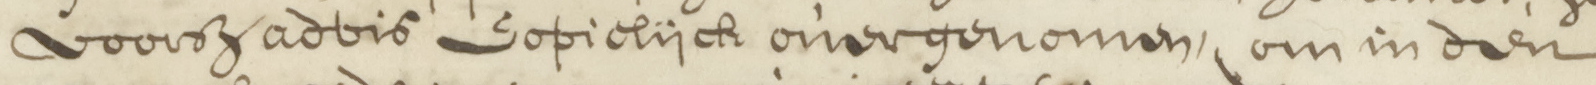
voorsz advis Copielijck ouergenomen, om in den
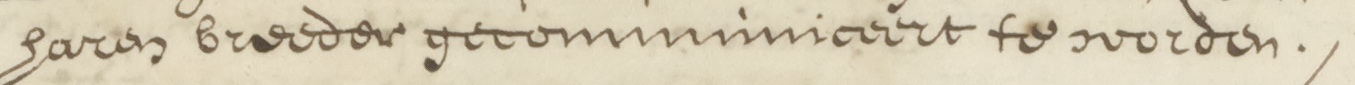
haren breeder gecommuniceert te worden.
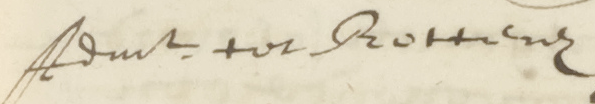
Admt. tot Rotterm
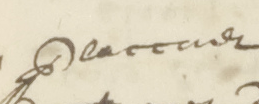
Placcaet
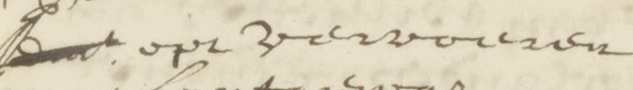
Admt. opt vervoeren
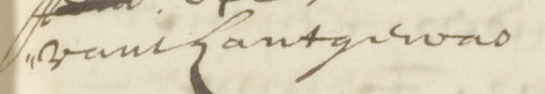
„vant Lantgewas
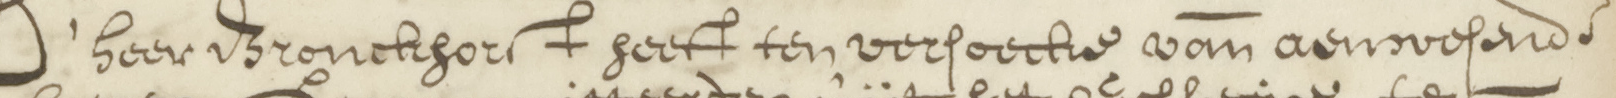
D'heer Bronckhorst heeft ten versoecke van aenwesende
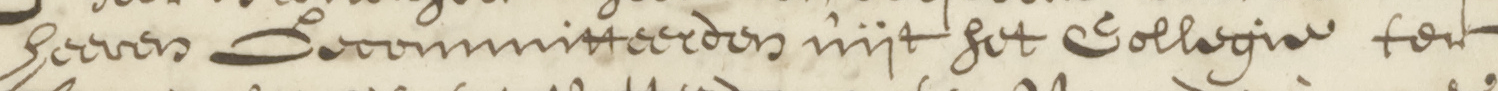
heeren Gecommitteerden uijt het Collegie ter
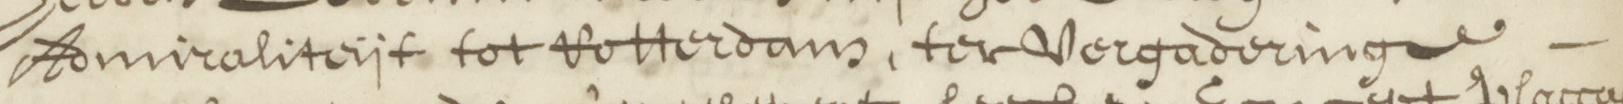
Admiraliteijt tot Rotterdam, ter Vergaderinge —
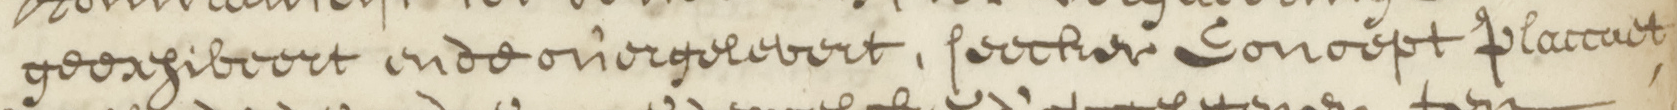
geexhibeert ende ouergelevert, seecker Concept placcaet,
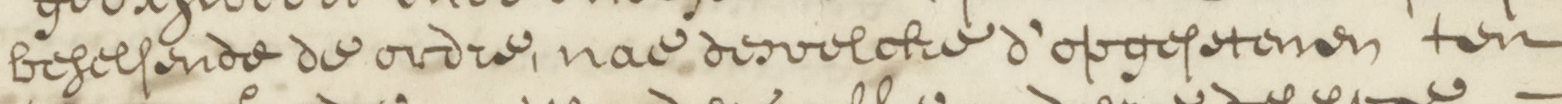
behelsende de ordre, nae dewelcke d'opgesetenen ten
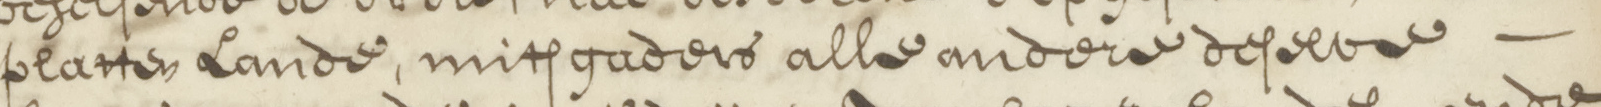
platten Lande, mitsgaders alle andere deselve —
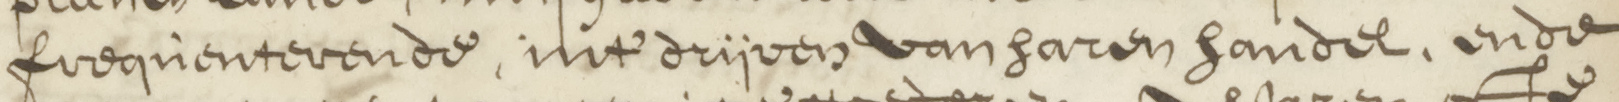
frequenterende, int' drijven van haren handel, ende
